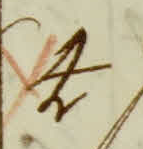4
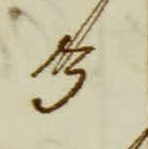3
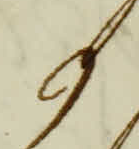9
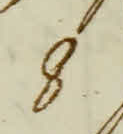8
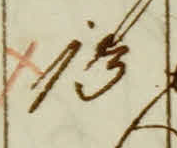13
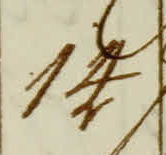14
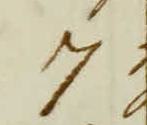7
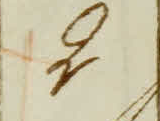2
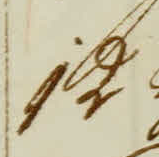12
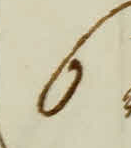6
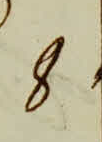8
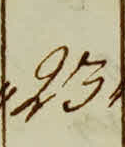23
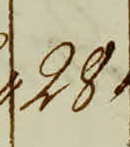28
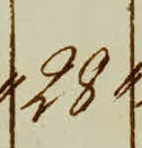28
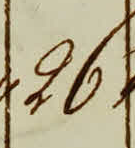26
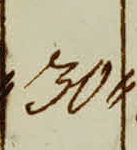30
